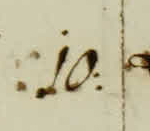10:
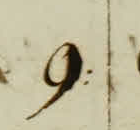9:
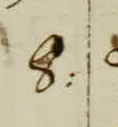8:
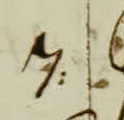7:
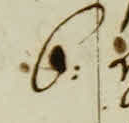6:
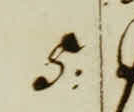5:
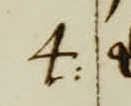4:
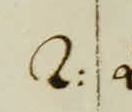2:
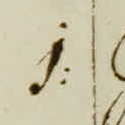1:
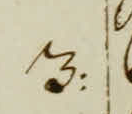3:
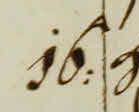16:
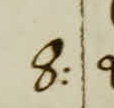8:
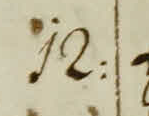12:
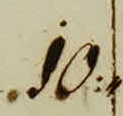10:
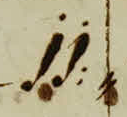11:
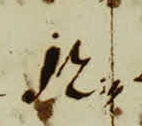12:
